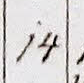14
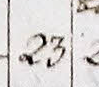23
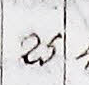25
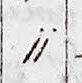11
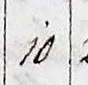10
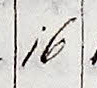16
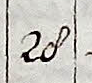28
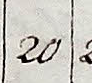20
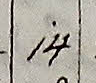14
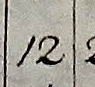12
